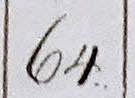64.
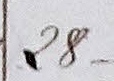28
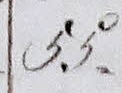55
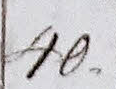40
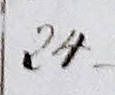24
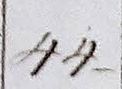44
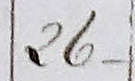26
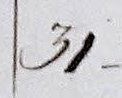31
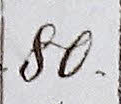80
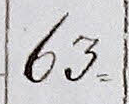63
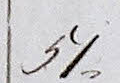51
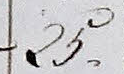25
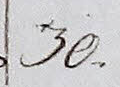30
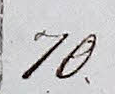70
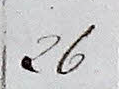26
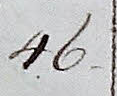46
